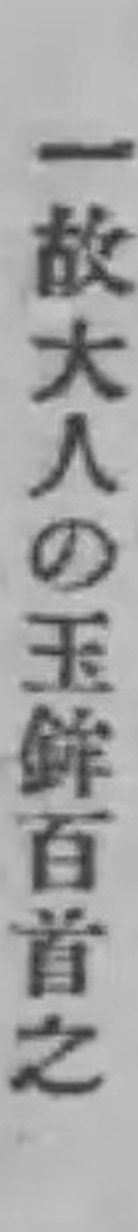一故大人の玉鉾百首之
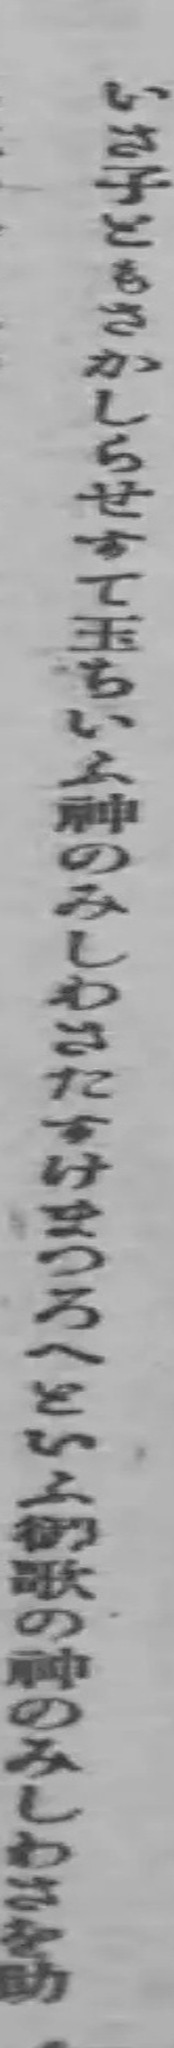いさ子ともさかしらせすて玉ちいふ神のみしわさたすけまつろへといふ御歌の神のみしわさを助
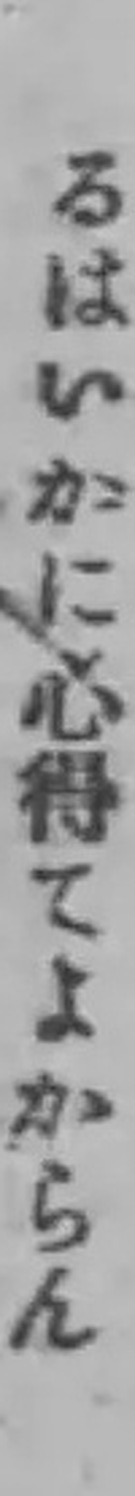るはいかに心得てよからん
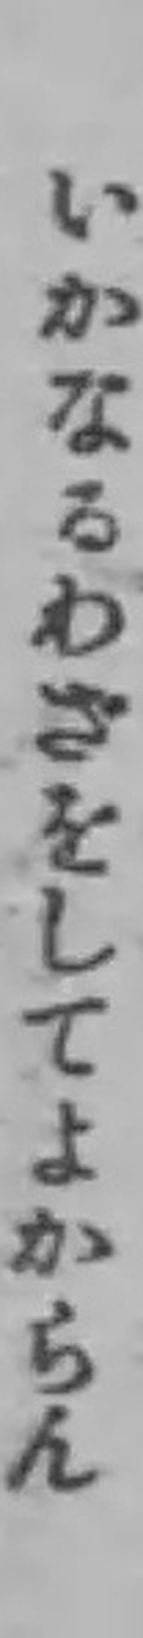いかなるわざをしてよからん
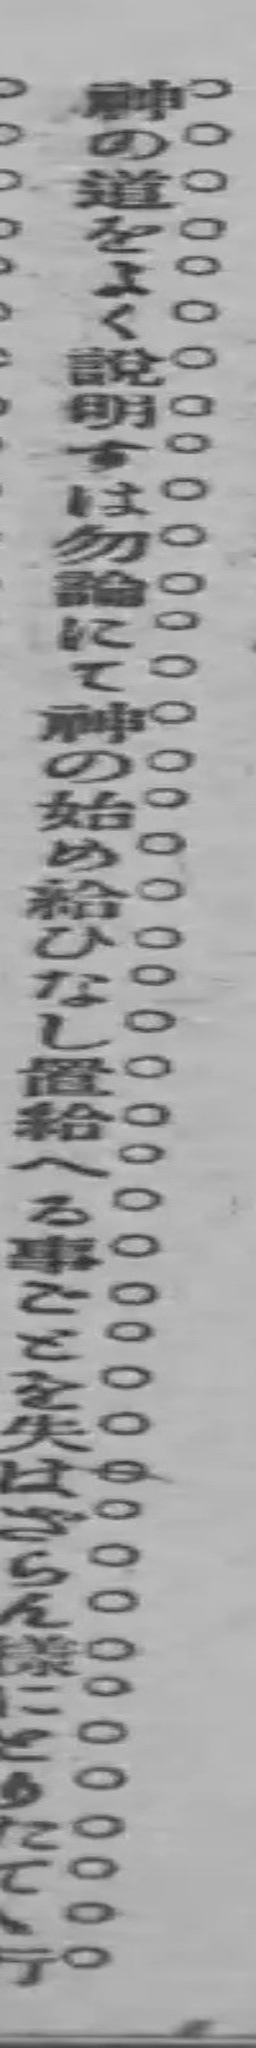神の道をよく説明すは勿論にて神の始め給ひなし置給へる事ごとを失はざらん様にとりたてゝ行
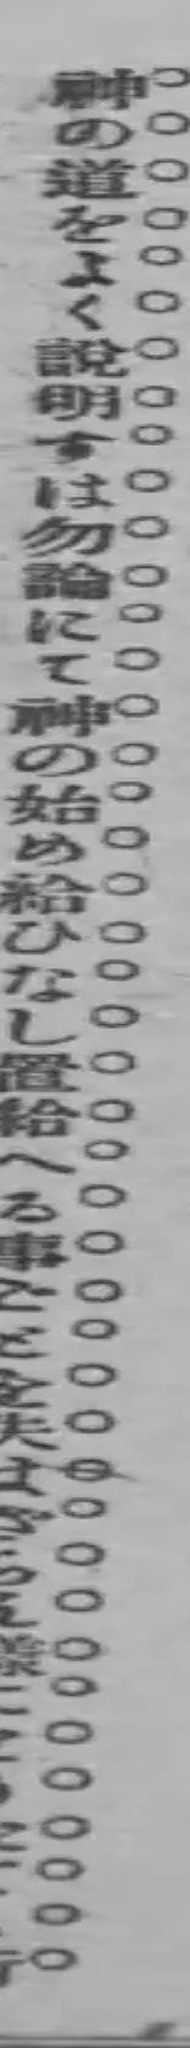神の道をよく説明すは勿論にて神の始め給ひなし置給へる事ごとを失はざらん様にとりたてゝ行
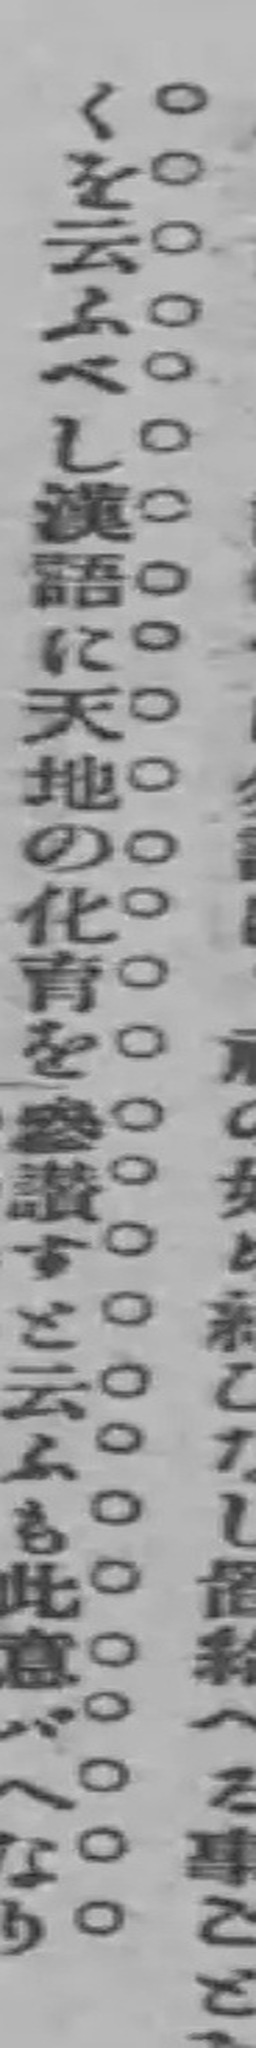くを云ふべし漢語に天地の化育を参讃すと云ふも此意バへなり
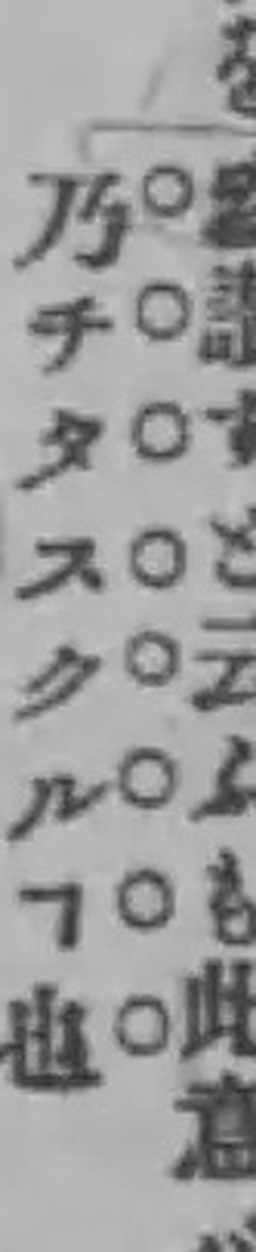乃チタスクルコト也
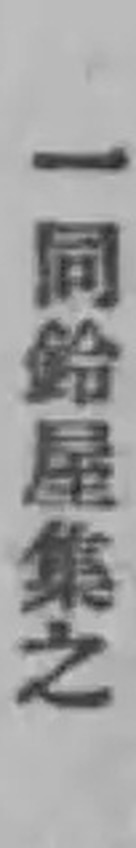一同鈴屋集之
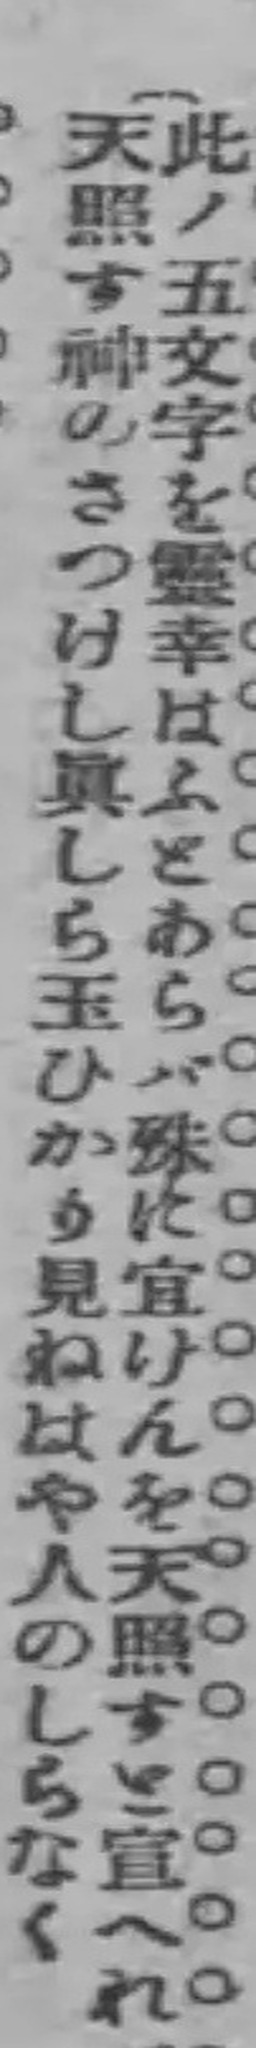天照す神のさつけし眞しら玉ひかり見ねはや人のしらなく
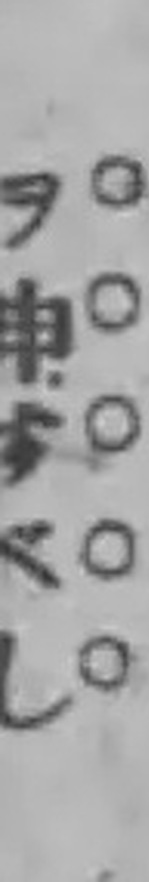ヲ申すべし
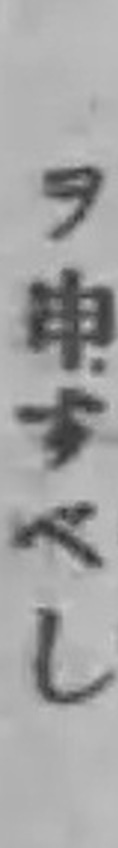ヲ申すべし
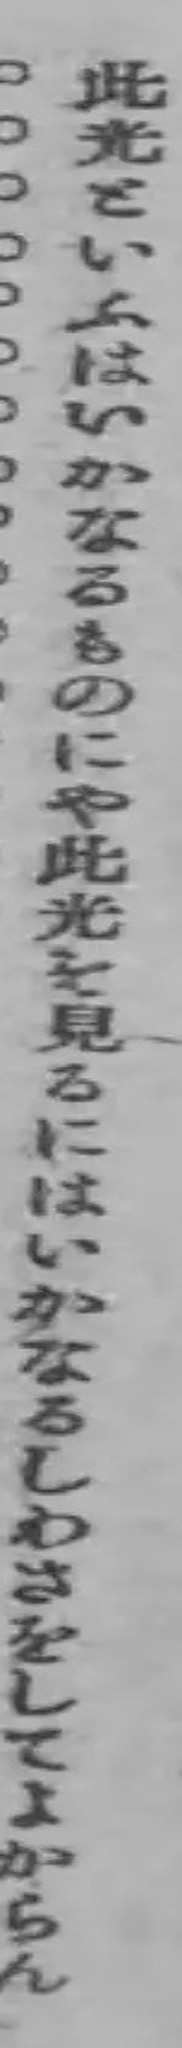此光といふはいかなるものにや此光を見るにはいかなるしわさをしてよからん
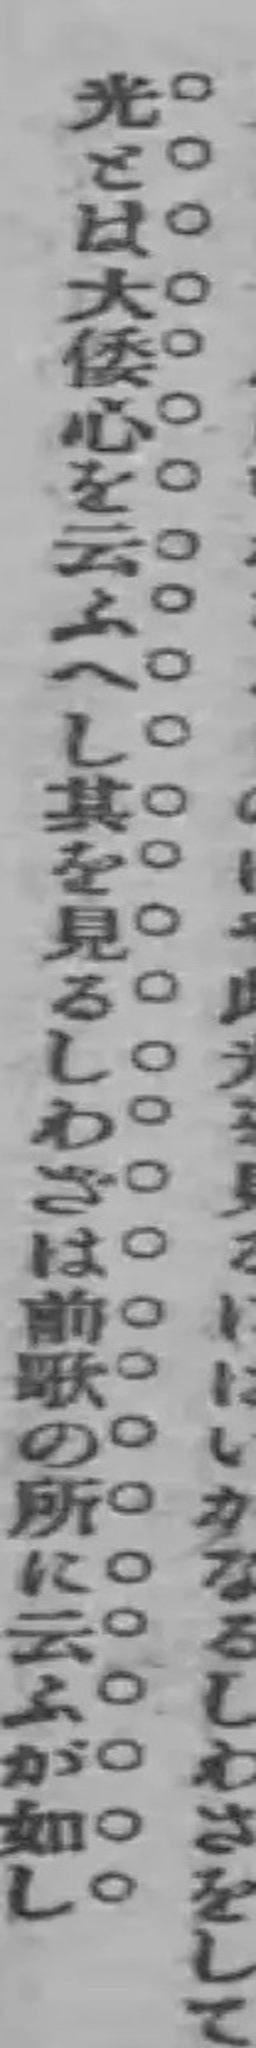光とは大倭心を云ふへし其を見るしわざは前歌の所に云ふが如し
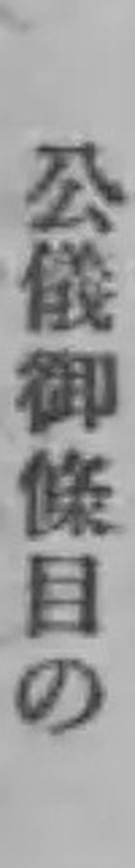公儀御条目の
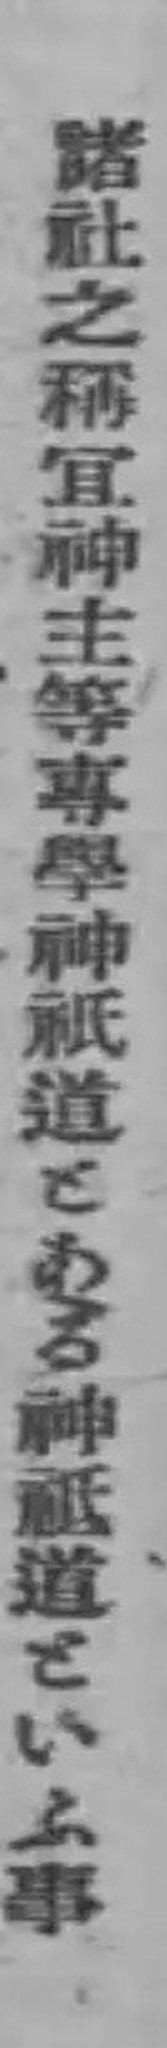諸社之称宜神主等専学神祇道とある神祇道といふ事
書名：豊橋市史談
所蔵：国立国会図書館 National Diet Library, JAPAN
